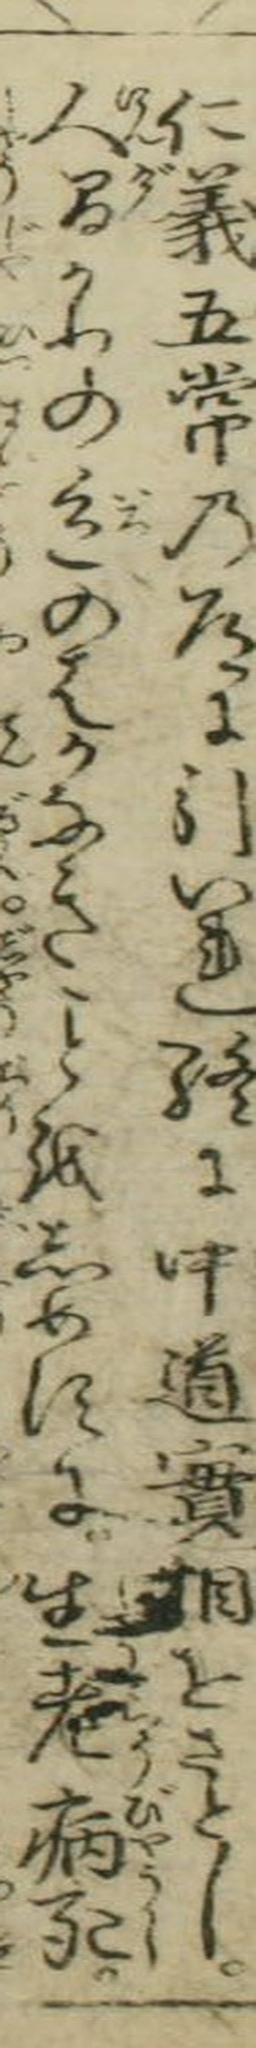人間かりの色のはかなきことをしめすに。生老病死。
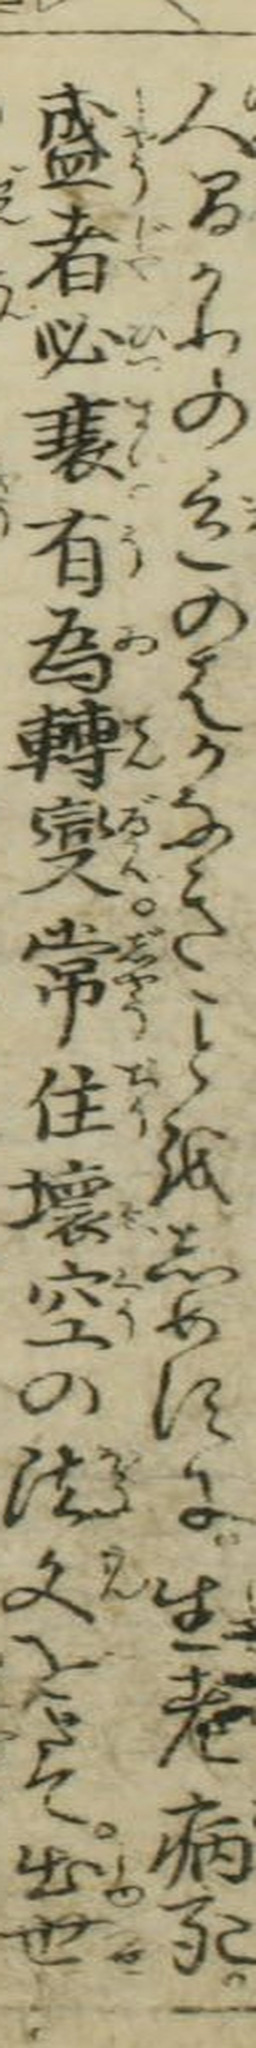盛者必衰。有為転変。常住壊空の法文をたて。出世
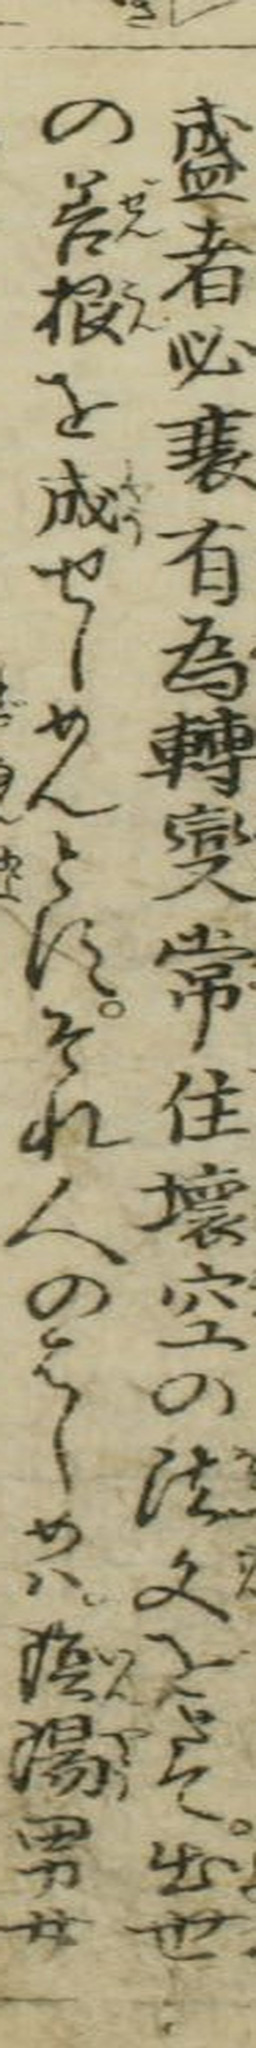の善根を成せしめんとす。それ人のはしめは。陰陽男女
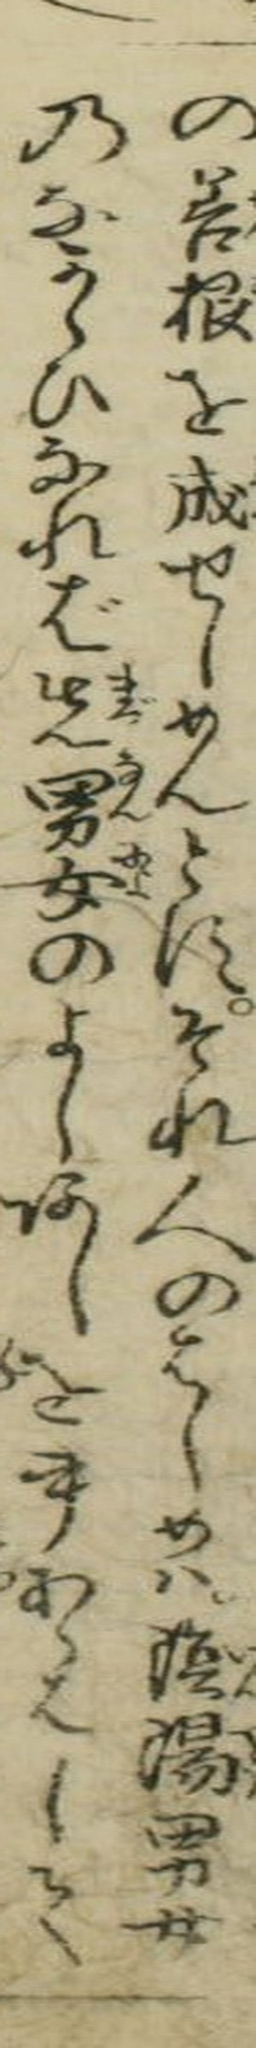のなからひなれば先男女のよしあしを書あらはして
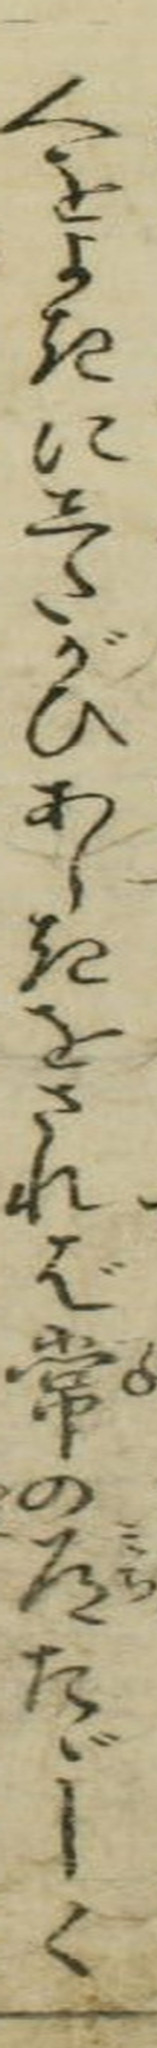人をよきにしたがひあしきをされば常の道たゞしく
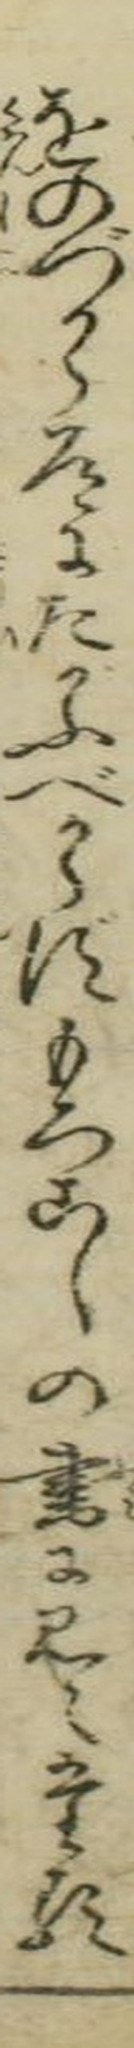をのづから道にたかふべからずもろこしの書に見えたる
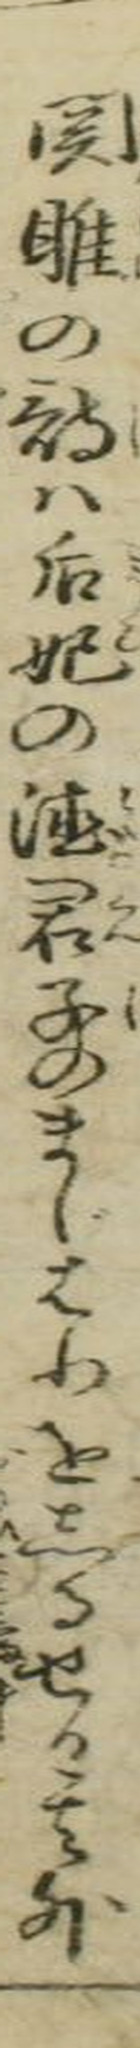関雎の詩は后妃の徳君子のまじはりをしるせる其外
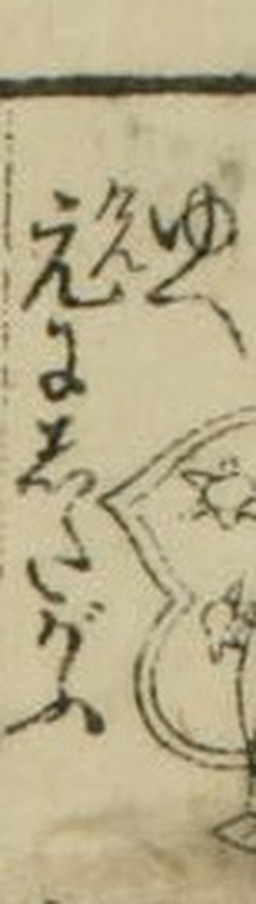元にしたがふ
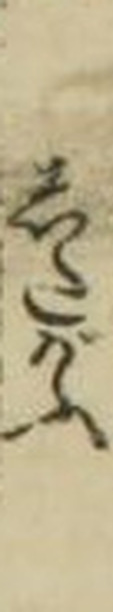したがふ
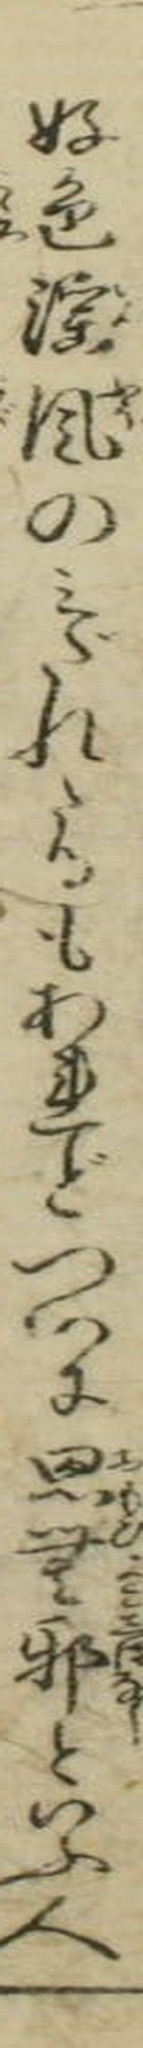好色淫風のみだれたるもあれどついに思無邪といふ人
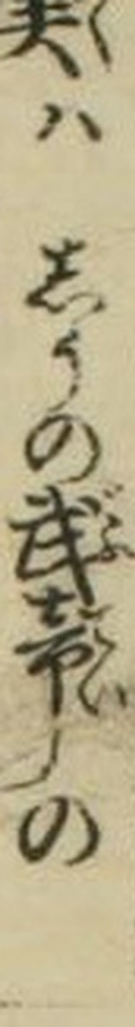幞はしうの武帝の
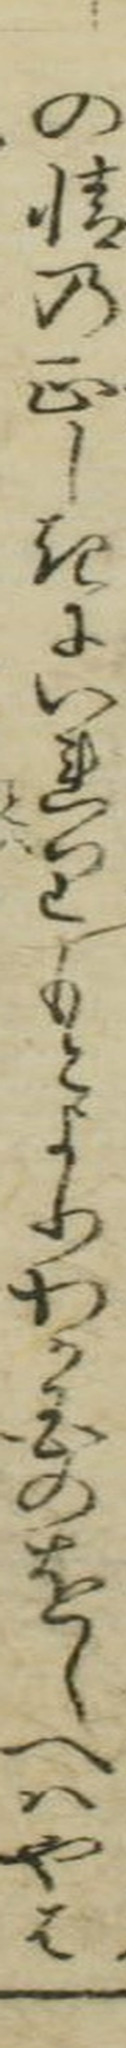の情の正しきにいれりもとよりわか国のをしへはやは
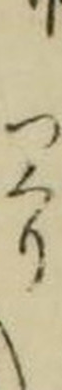つくり
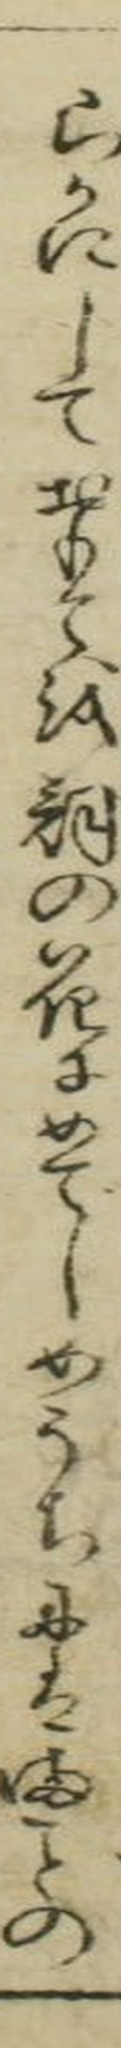らかにしておもてを詞の花にめでしめうちにはまことの
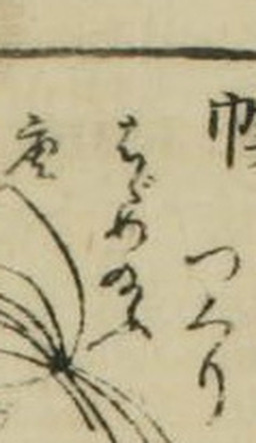はゞめ給ふ
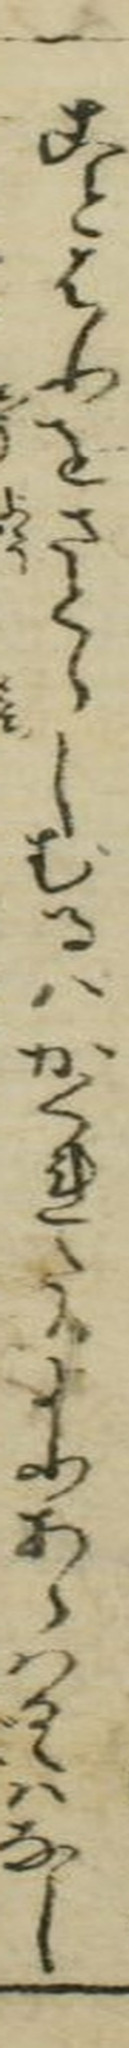ことはりをさとらしむるはかくれたるよりあらはるゝはなし
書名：女源氏教訓鑑
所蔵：東京学芸大学附属図書館
